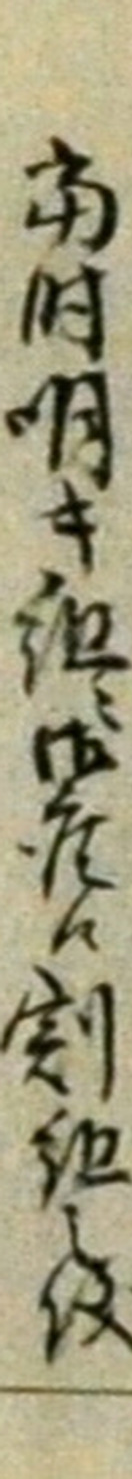当時明キ組ニ御座候割組之儀
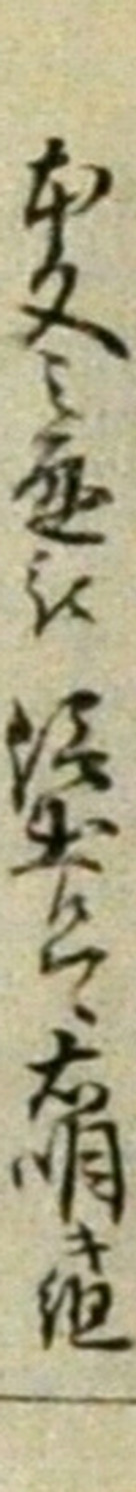本文之通被仰出候ハヽ右明キ組
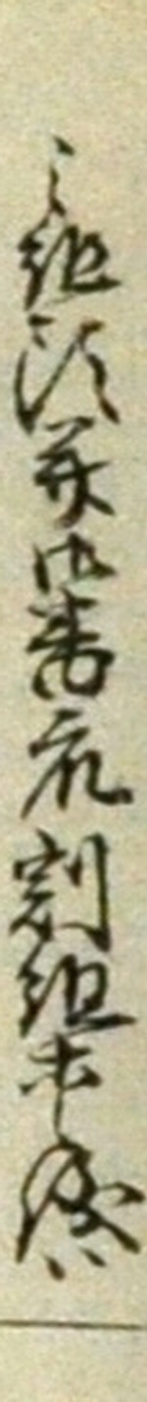之組頭并御番衆割組等之儀ハ
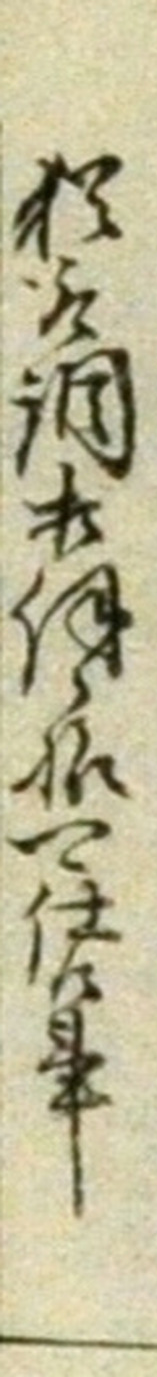猶取調相伺候様可仕候事
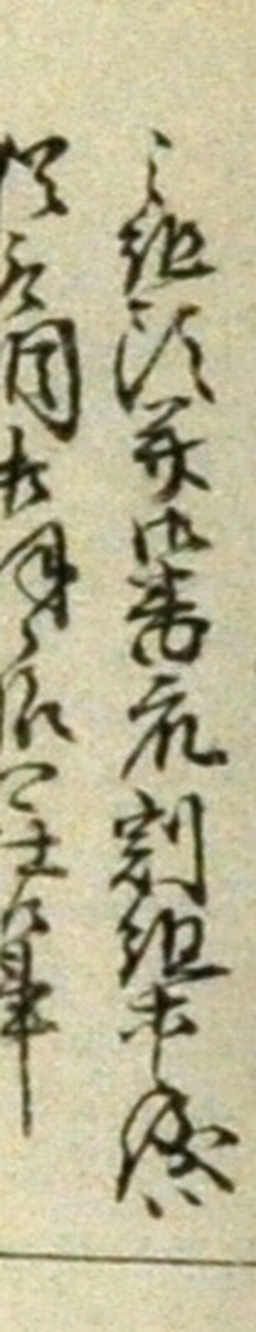猶取調相伺候様可仕候事
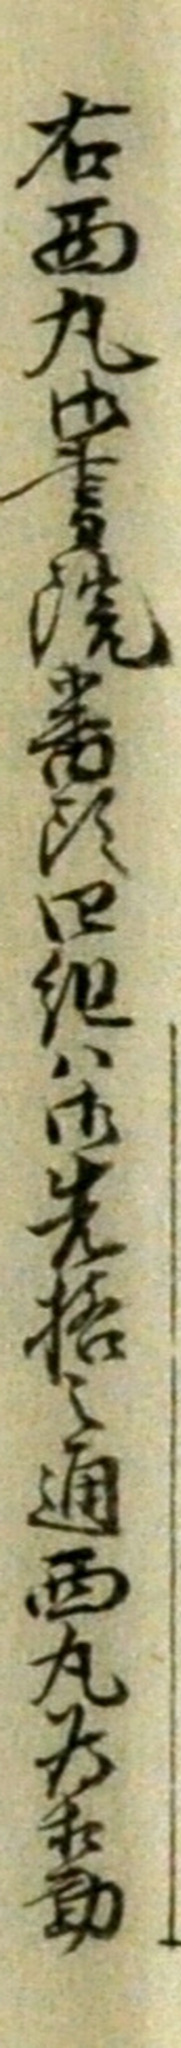右西丸御書院番頭四組ハ御先格之通西丸為相勤
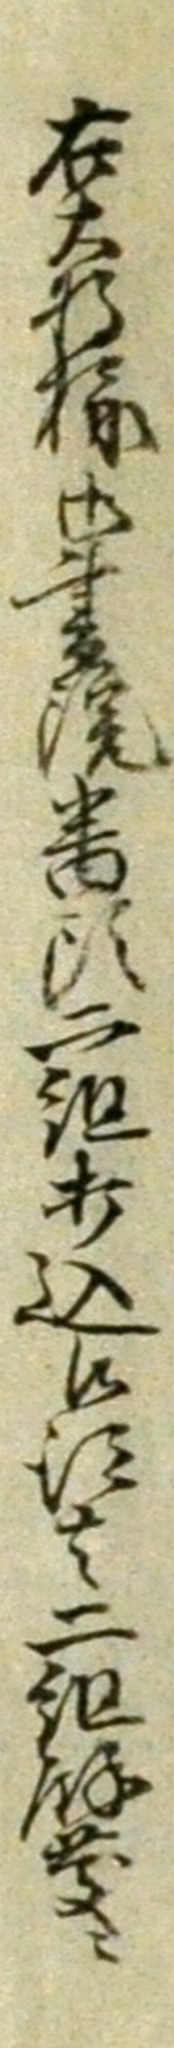右大将様御書院番頭二組打込候得者二組餘慶ニ
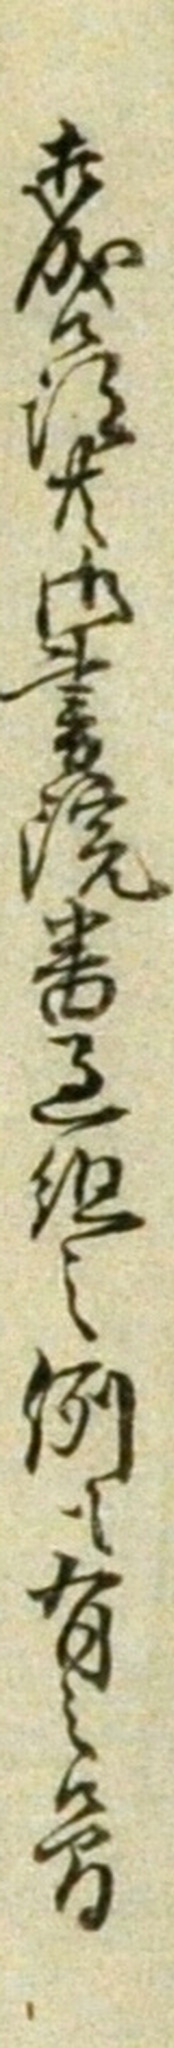相成候得共御書院番過組之例も有之候間
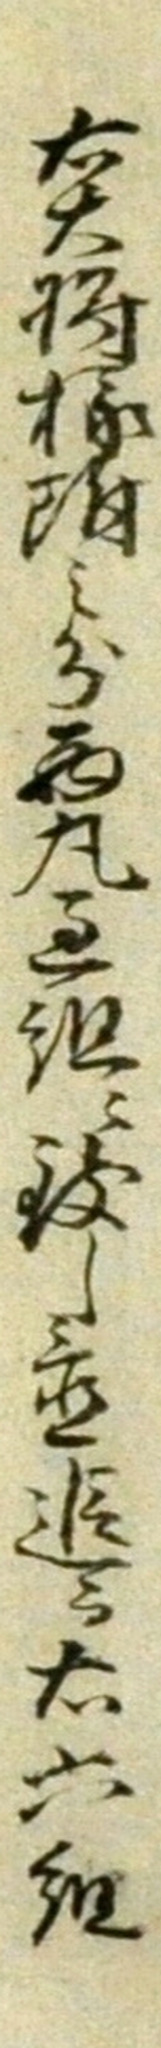右大将様附之分西丸過組ニ致し置追而右六組
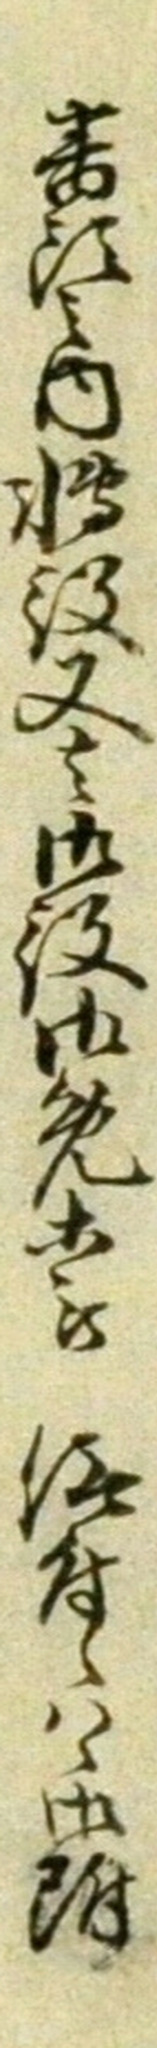番頭之内轉役又者御役御免等被仰付候ハゝ御附
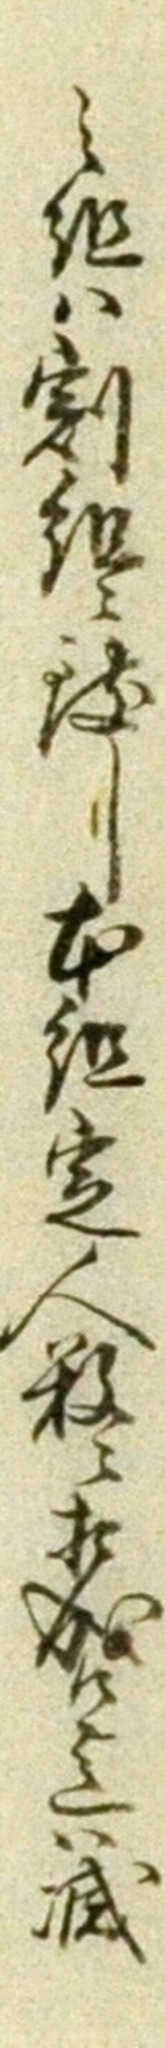之組ハ割組ニ致し本組定人数ニ相成候迄ハ減
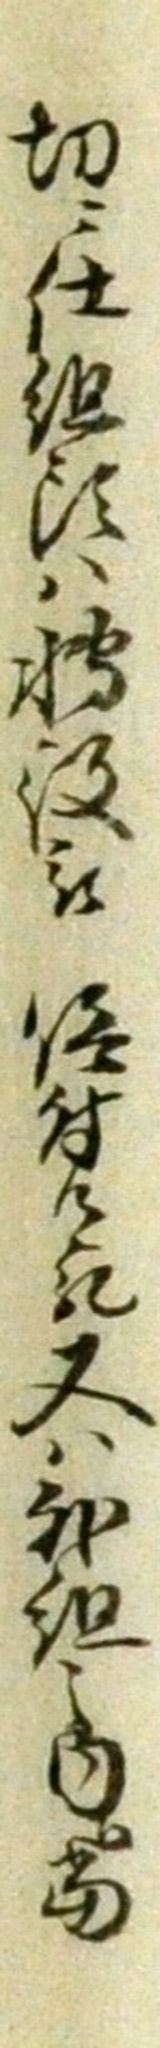切ニ仕組頭ハ轉役被仰付候歟又ハ外組之内江当
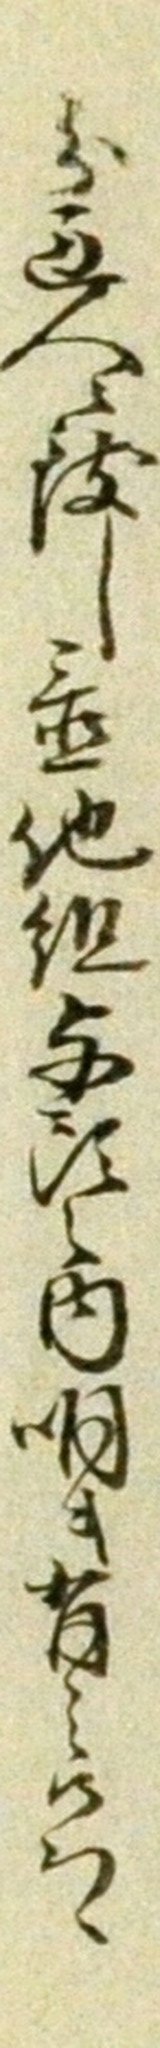分過人ニ致し置他組与頭之内明キ有之候ハゝ
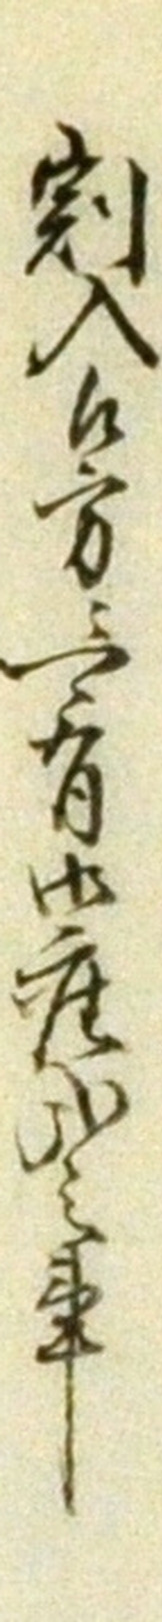割入候方ニ可有御座哉之事
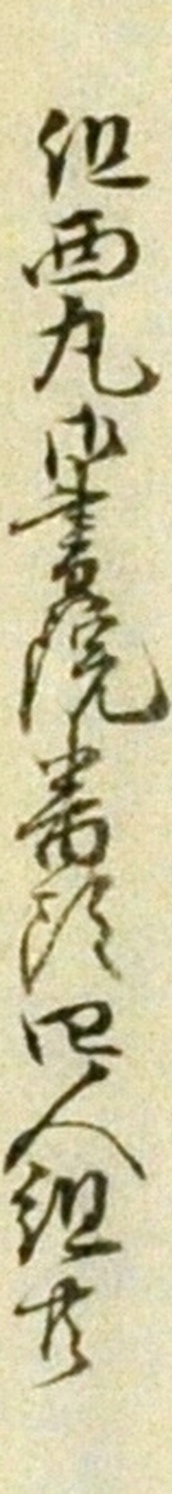但西丸御書院番頭四人組共
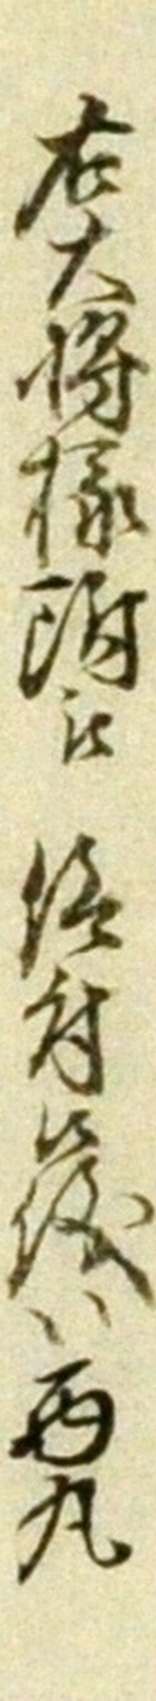右大将様附被仰付候儀ハ西丸
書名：若年寄御役中御調書付
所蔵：伊那市立高遠町図書館・合同会社AMANE
